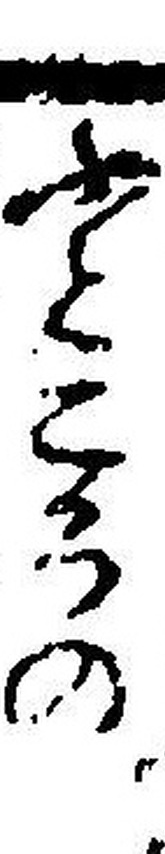ふところの
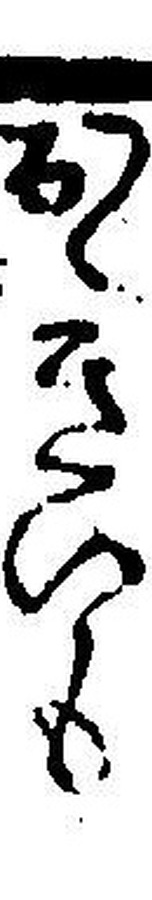おゝきいも
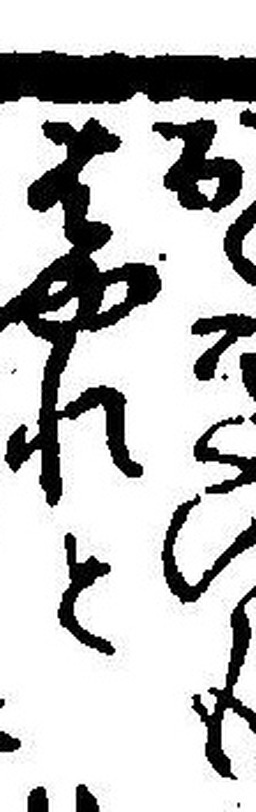はやれと
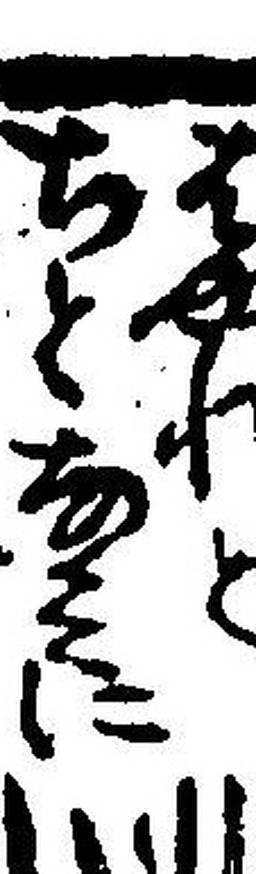ちとなみに
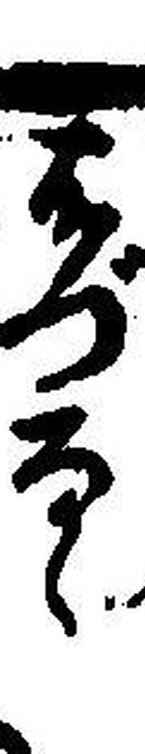はづるゝ
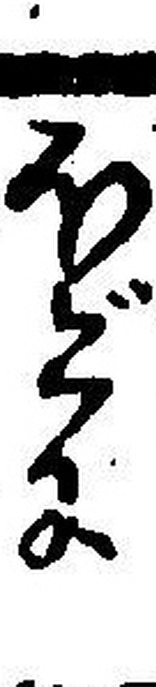ほどに
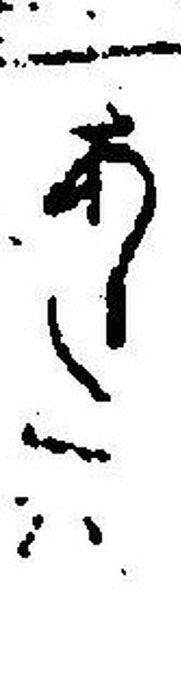あしたは
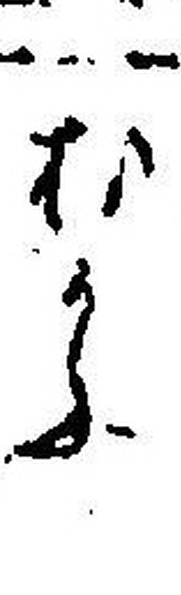むかふ
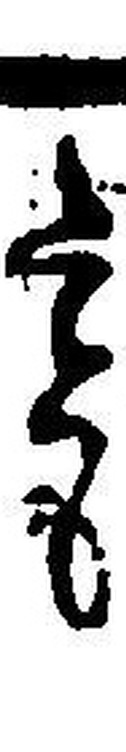たとも
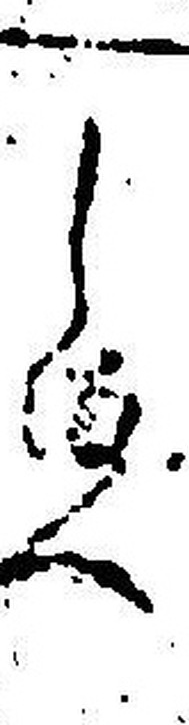しまへ
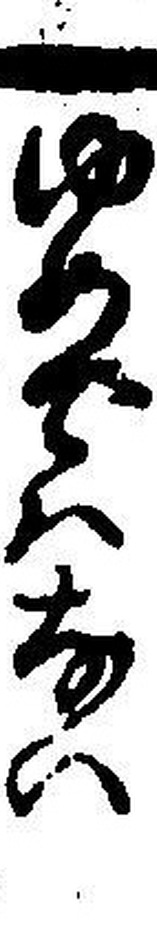ゆめではない
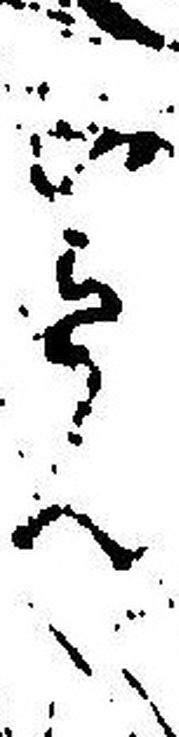いらしん
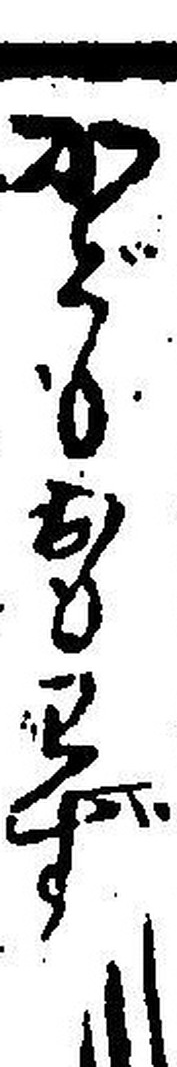かどもおもわず
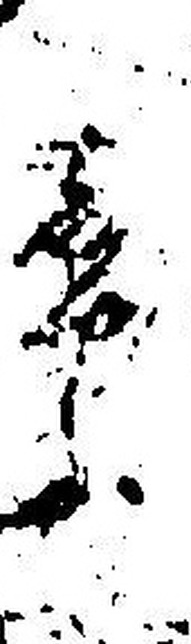しやふ
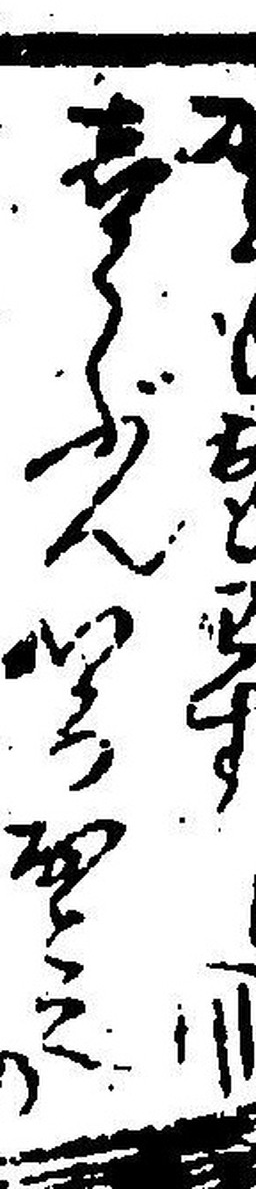しうぶんいろおとこの
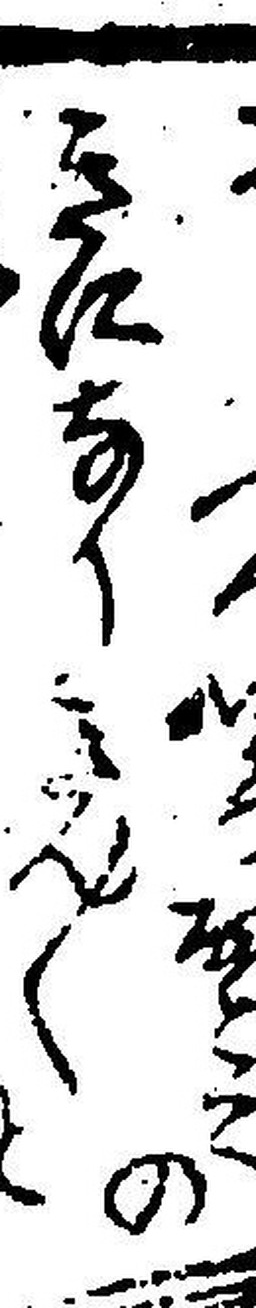きになりきん〳〵と
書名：間違狐之女郎買 / 市場通笑作
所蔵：東京大学総合図書館 General Library in the University of Tokyo, JAPAN
